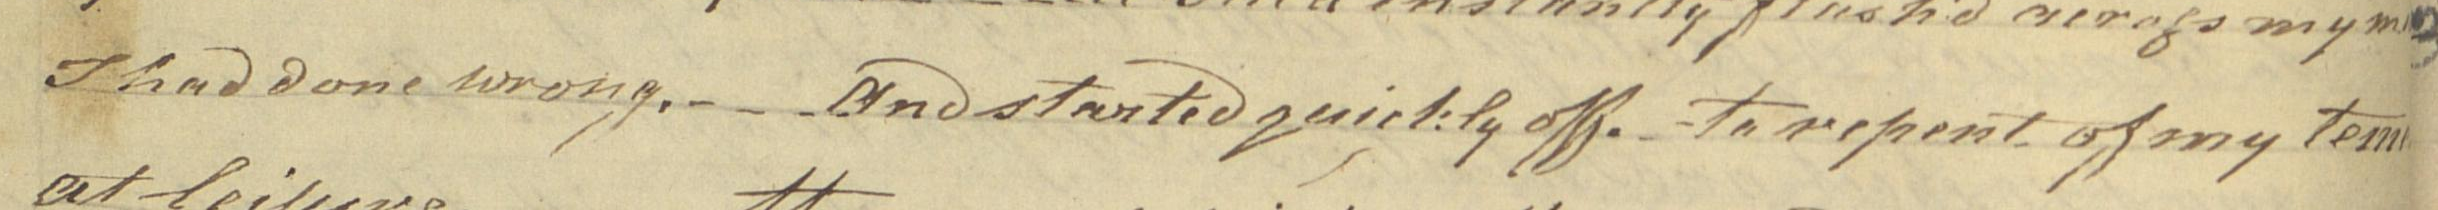I had done wrong. And started quickly off. to repent of my tem-
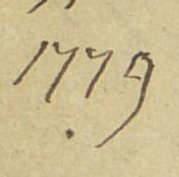1779
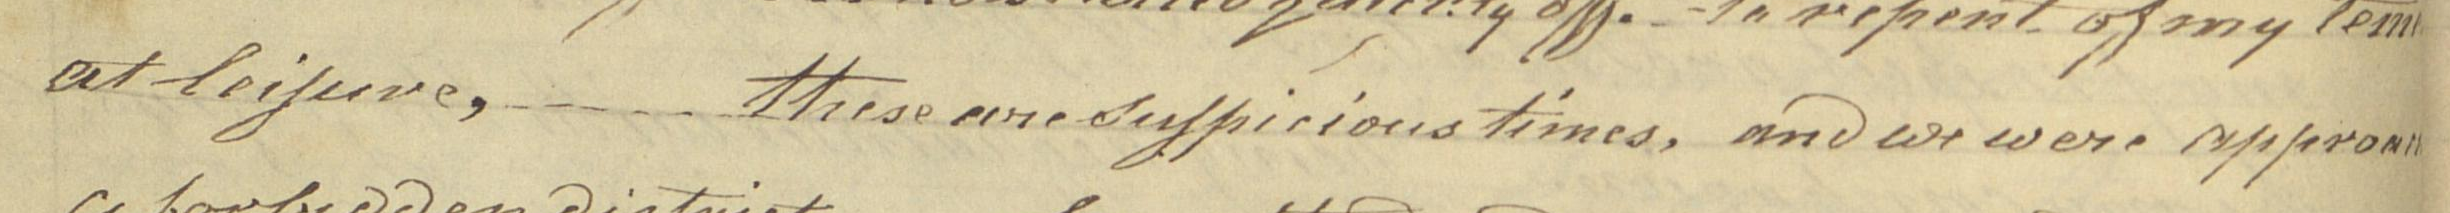at leisure, these are suspicious times, and we were apperon-
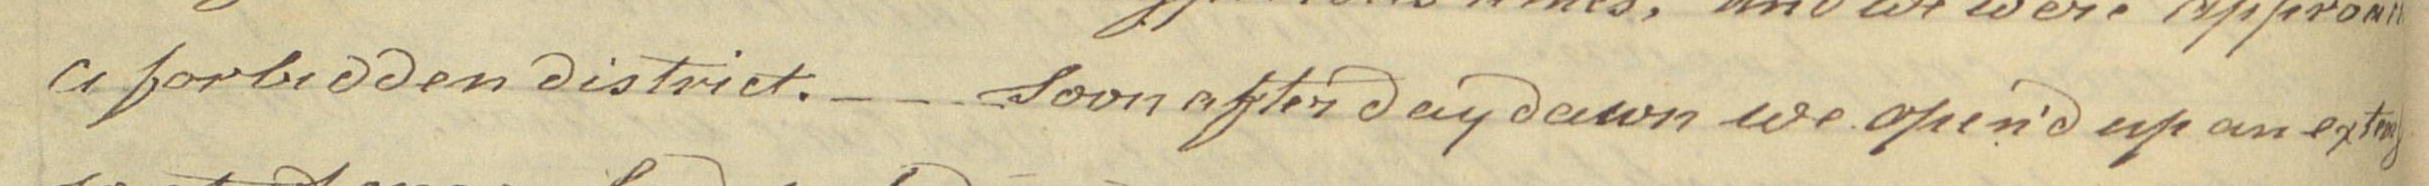a forbidden district. Soon after day dawn we open'd up an existing
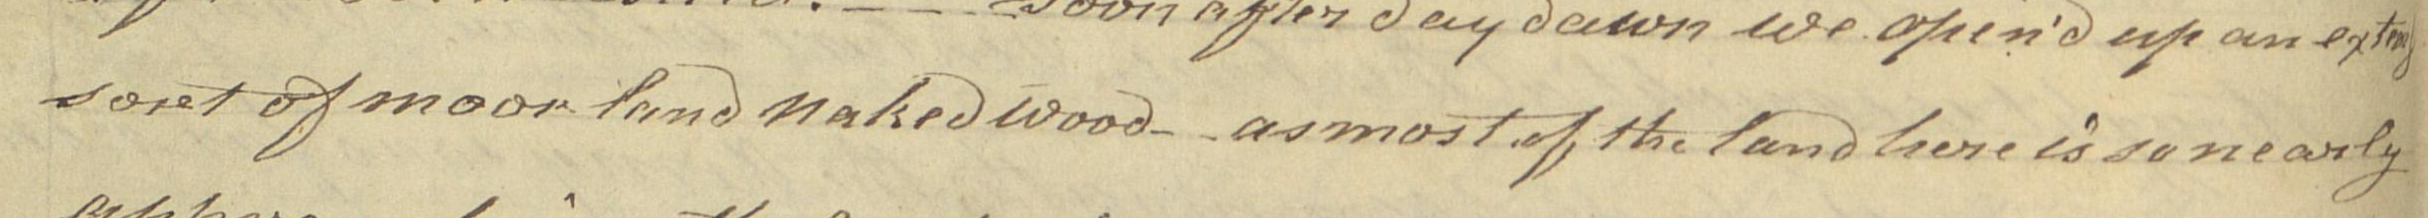sort of moorland naked wood as most of the land here is so nearly
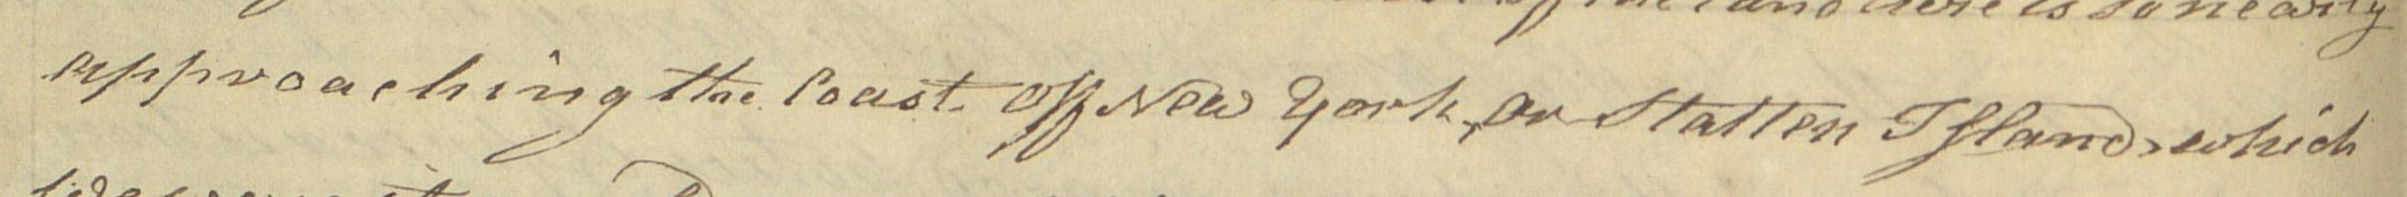approaching the coast off New York or Staten Island, which
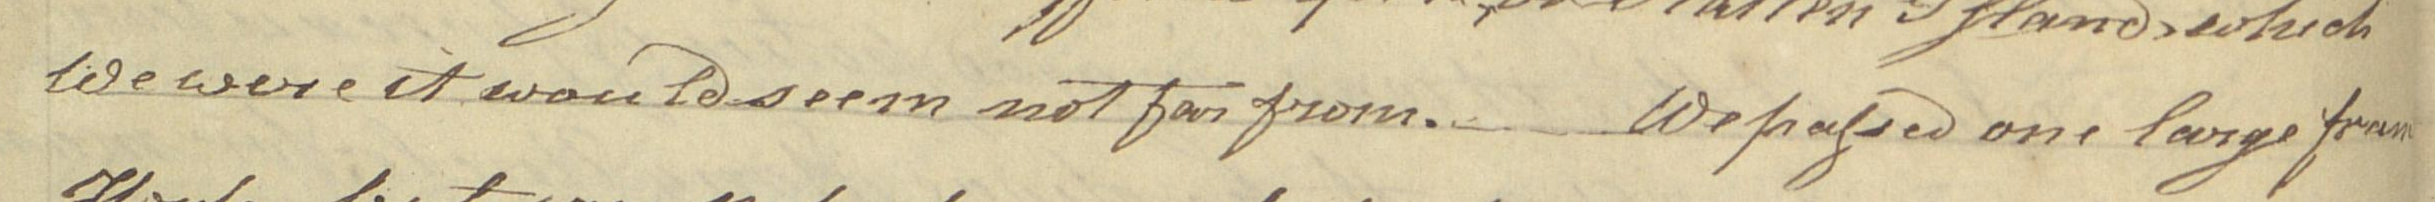We were it would seem not far from. We passed one large fro-
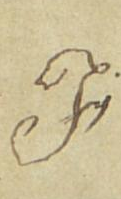F
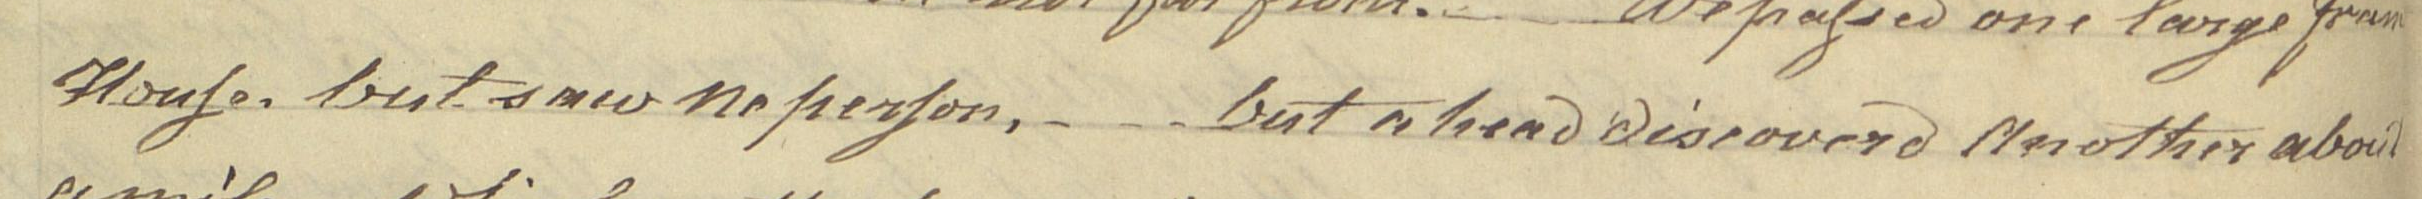House, but saw no person. but ahead discovered another about
